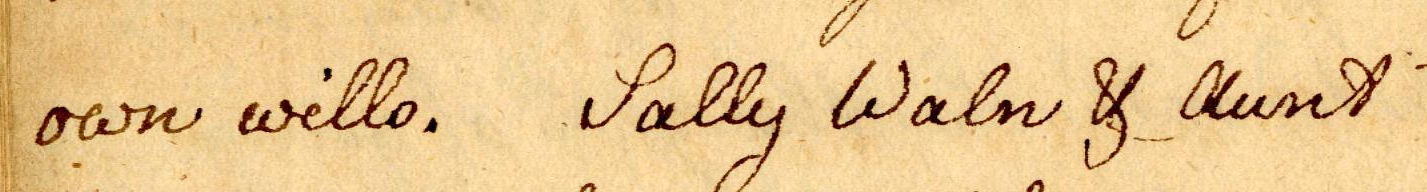own wills. Sally Waln & Aunt
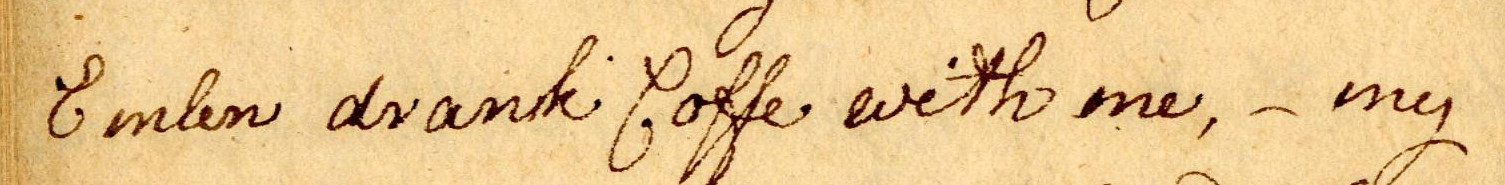Emlen drank Coffe with me,- my
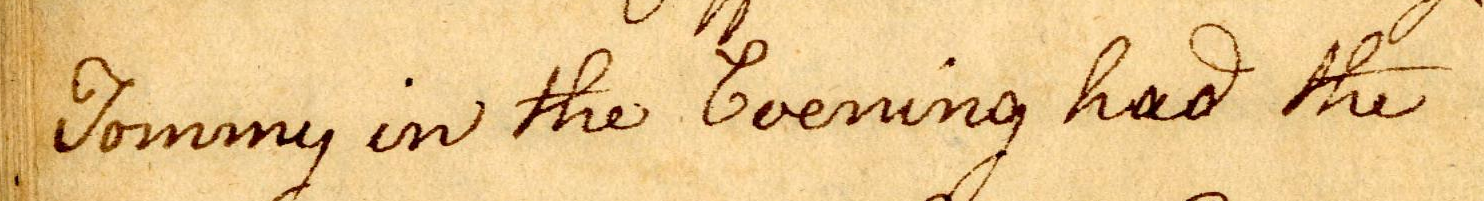Tommy in the Evening had the
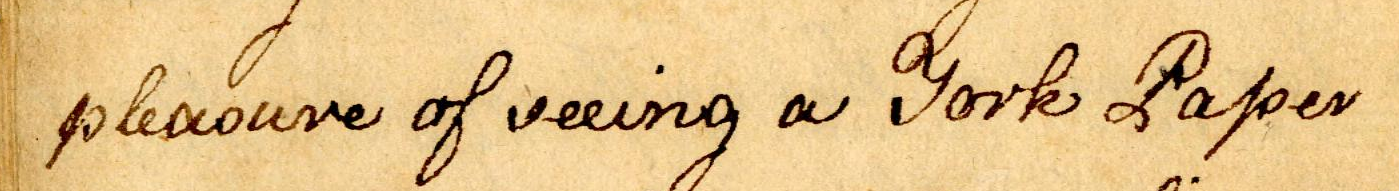pleasure of seeing a York Paper
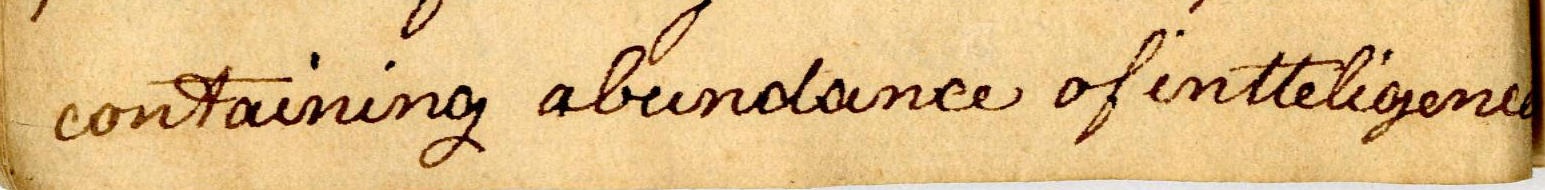containing abundance of intelligence
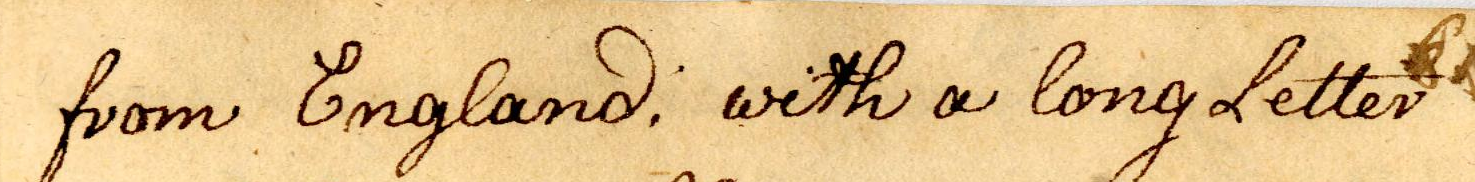from England. with a long Letter
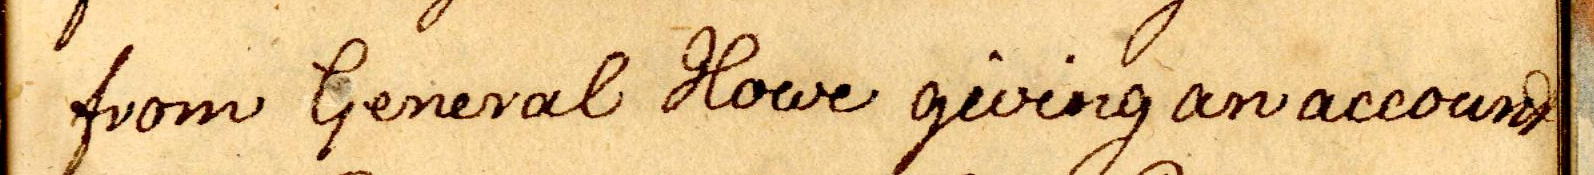from General Howe giving an account
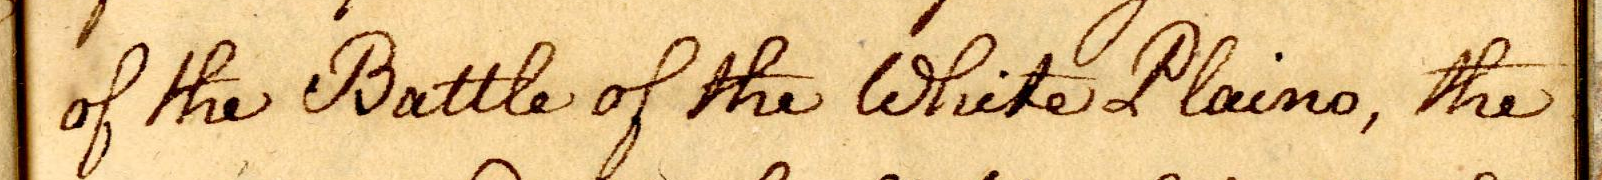of the Battle of the White Plains, the
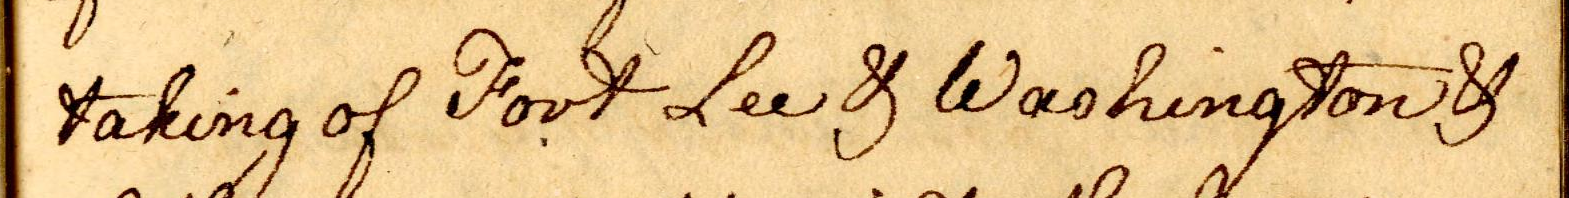taking of Fort Lee & Washington &
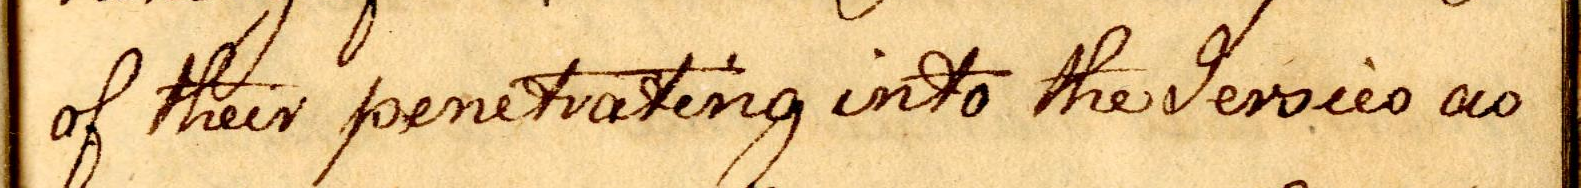of their penetrating into the Jersies as
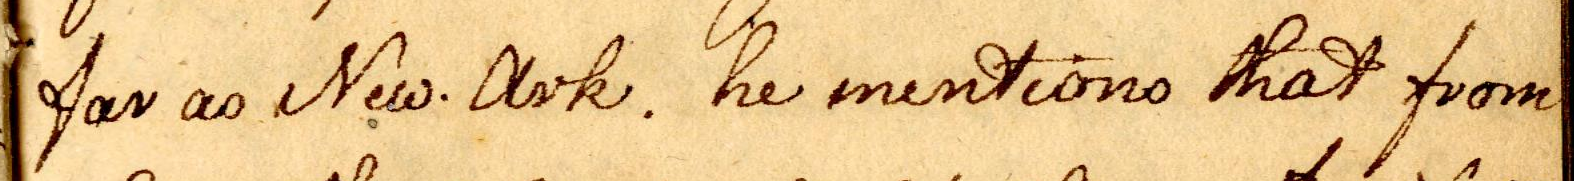far as New. Ark. he mentions that from
